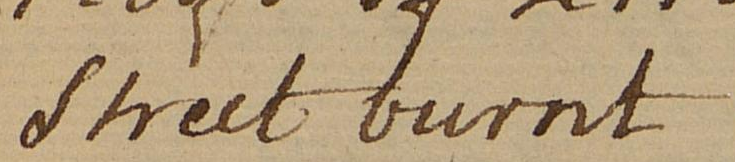Street burnt
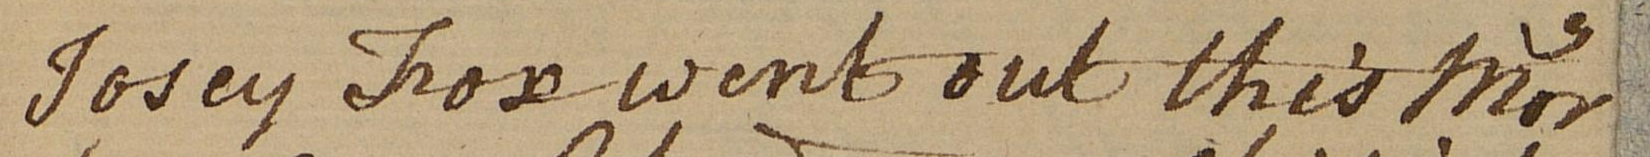Josey Fox went out this Mor^g
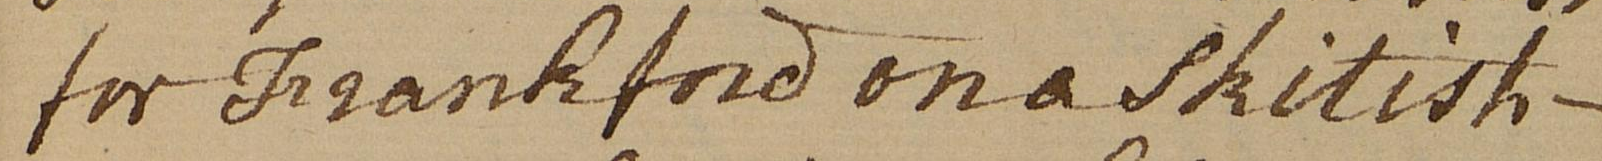for Frankford on a Skitish-
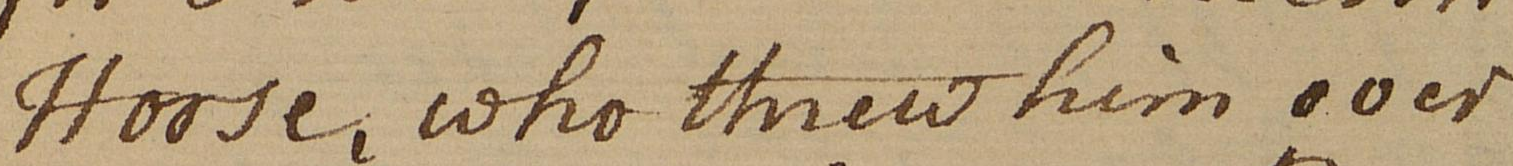Horse, who threw him over
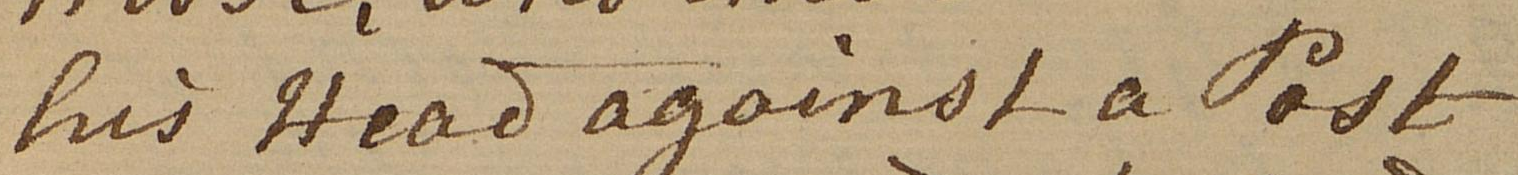his Head against a Post
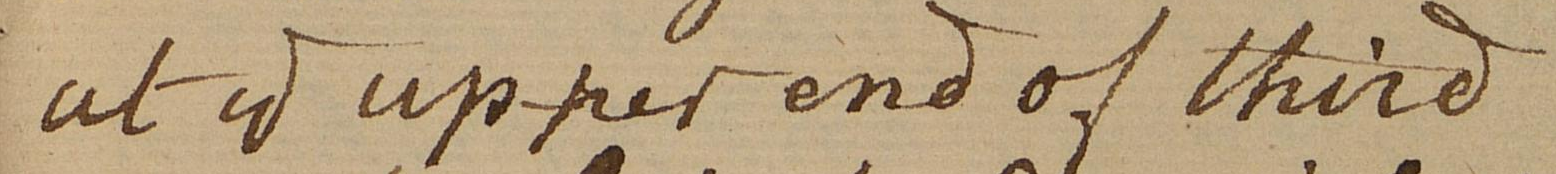at y^e upper end of third
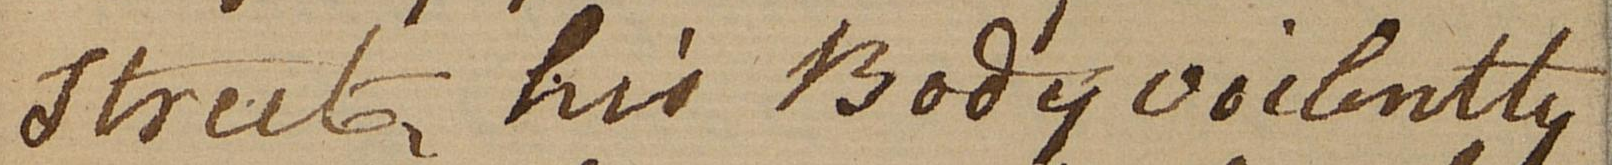Street, his Body voilently
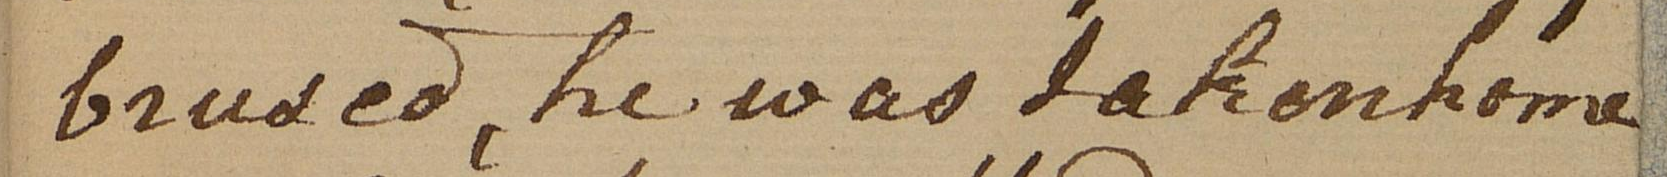brused, he was taken home
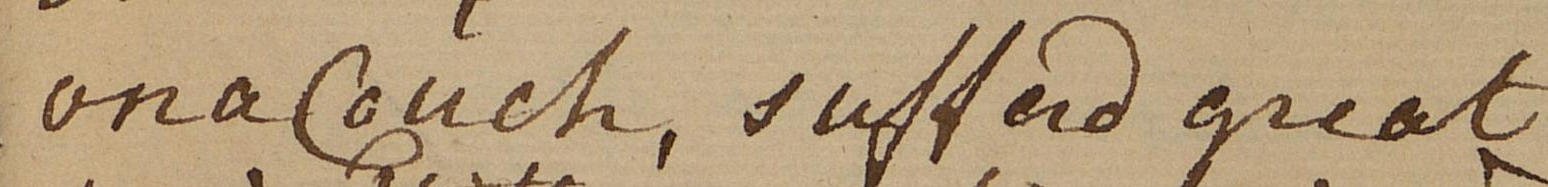on a Couch, sufferd great
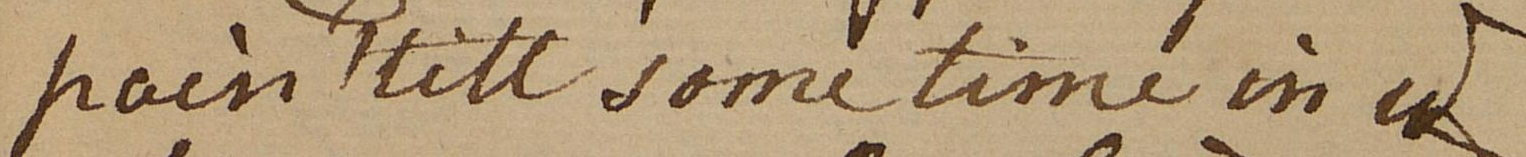pain 'till some time in y^e
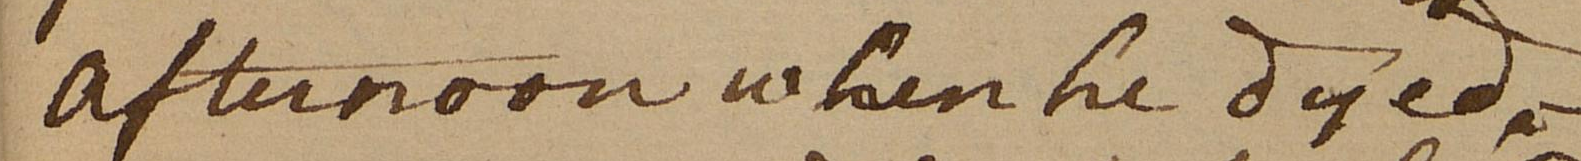afternoon when he dyed.
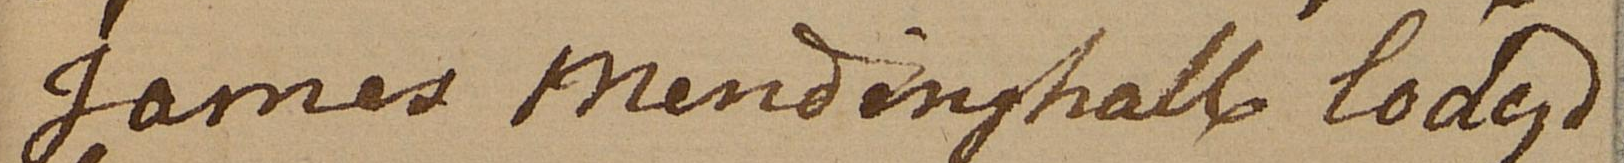James Mendinghall lodgd
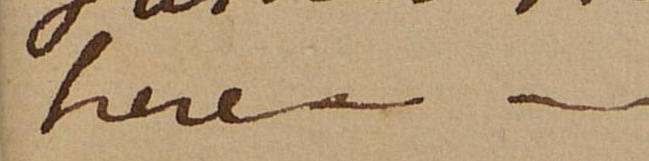here--
